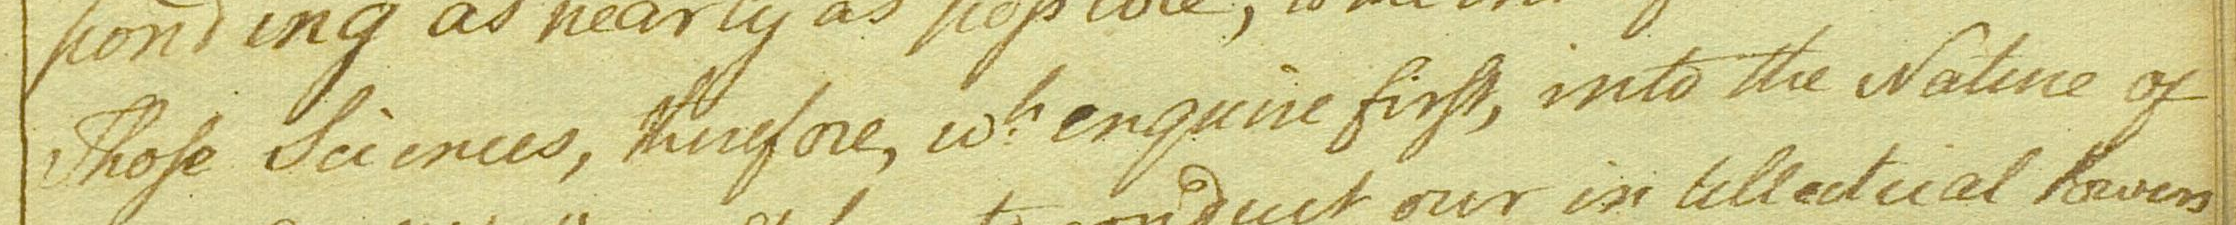Those Sciences, therefore, w^h. enquire first, into the Nature of
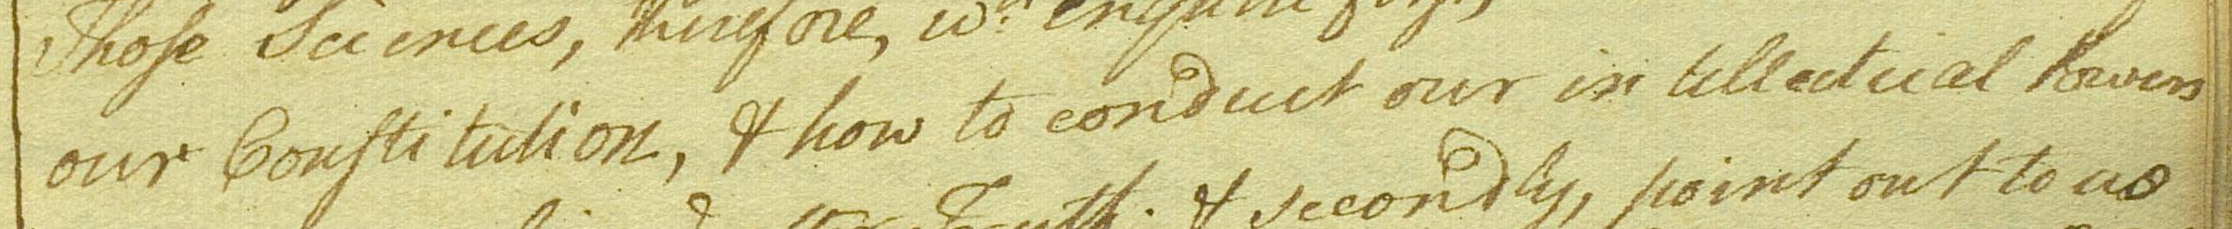our Constitution, & how to conduct our intellectual Powers
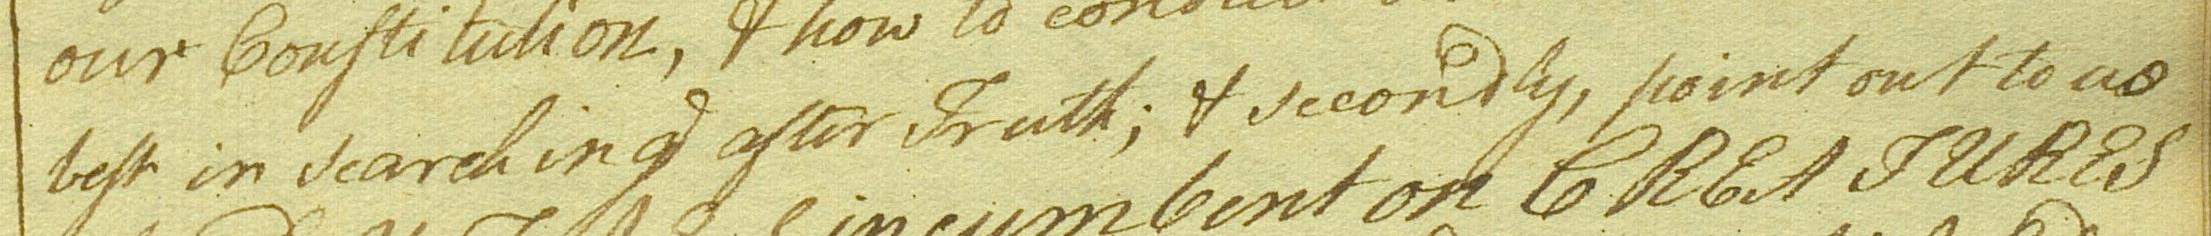best in searching after Truth; & secondly, point out to us
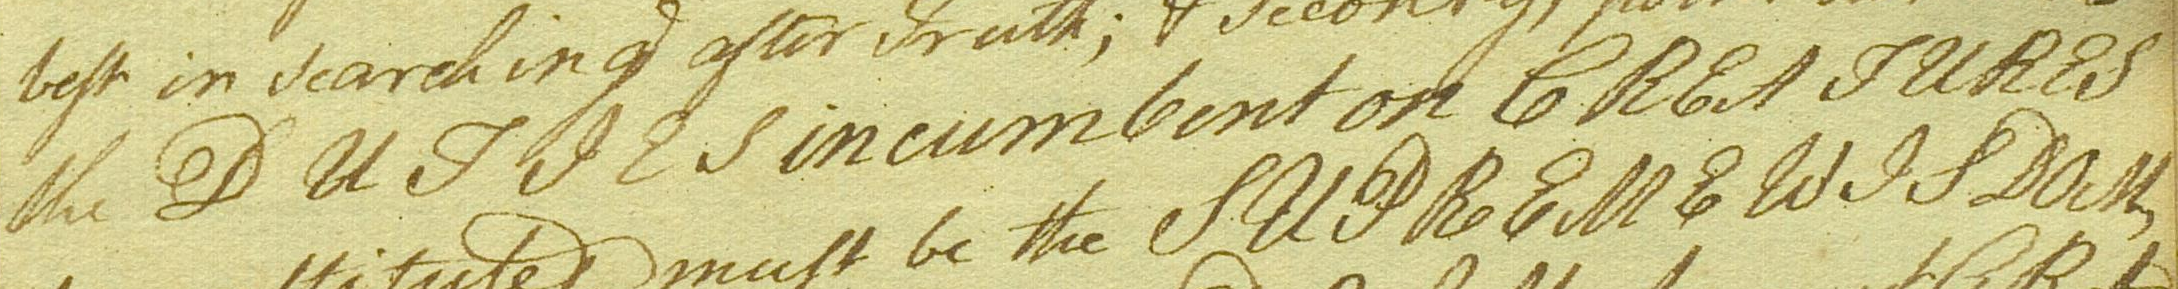the DUTIES incumbent on CREATURES
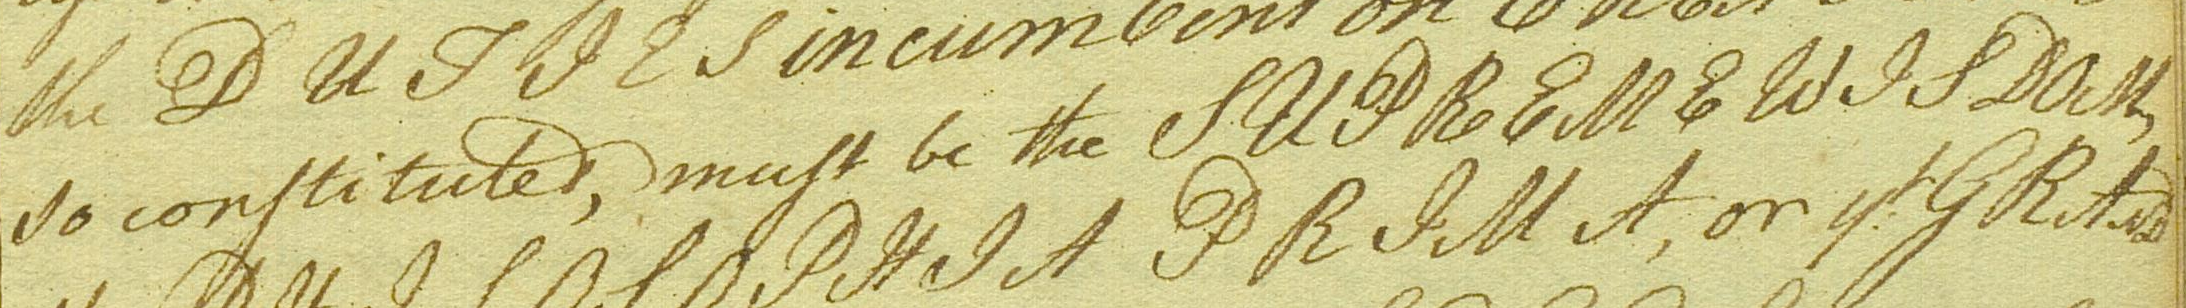so constituted, must be the SUPREME WISDOM,
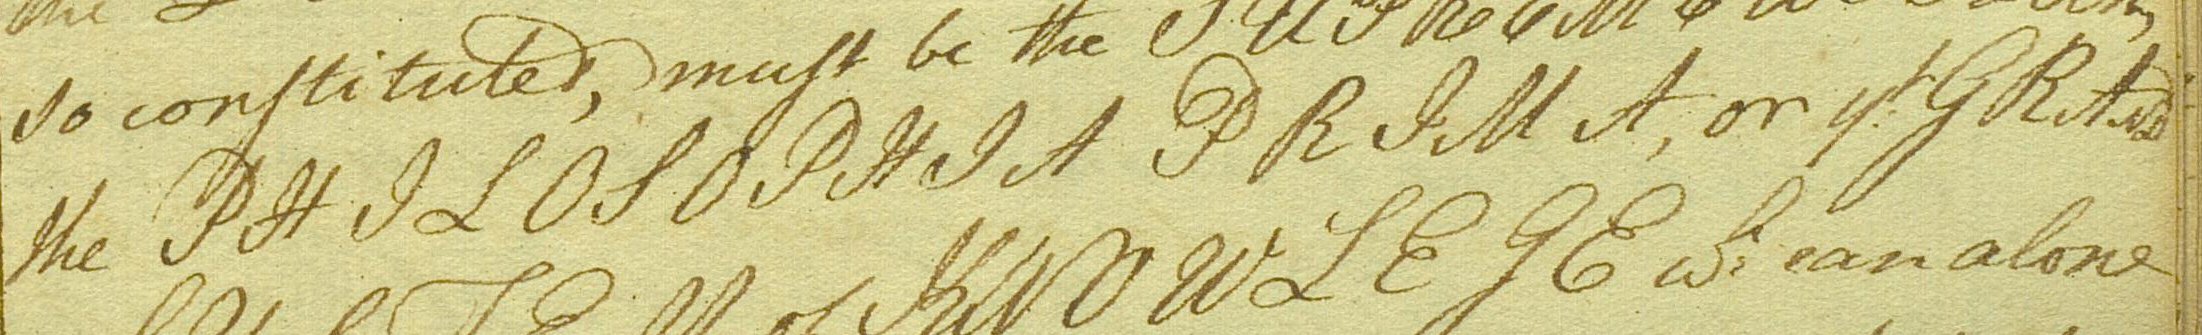the PHILOSOPHIA PRIMA, or y^e GRAND
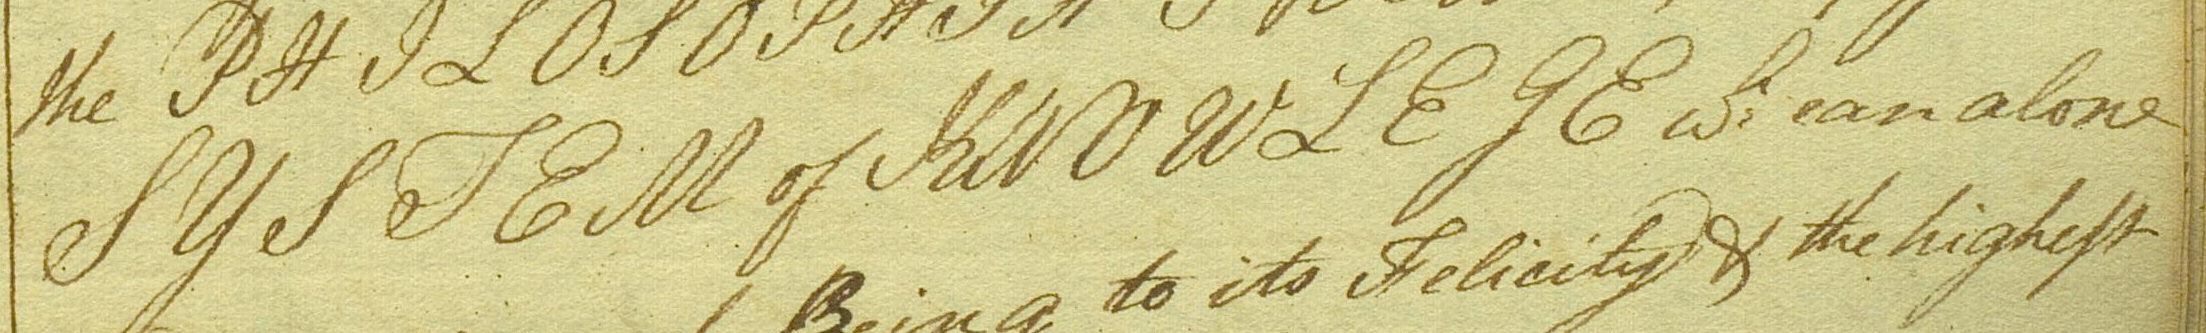SYSTEM of KNOWLEDGE w^h. can alone
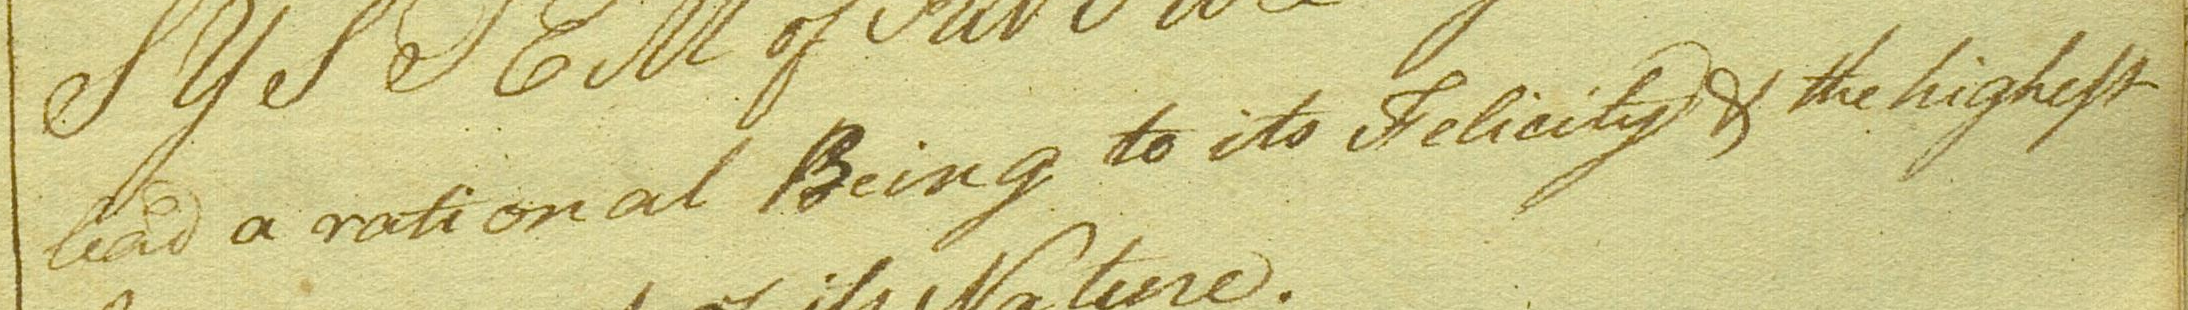lead a rational Being to its Felicity & the highest
